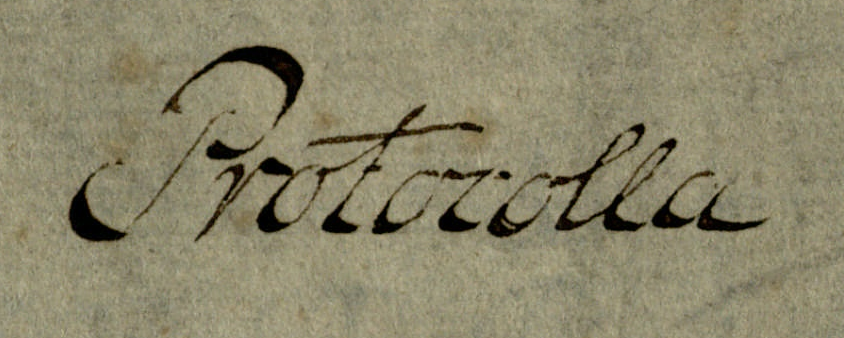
Protocolla
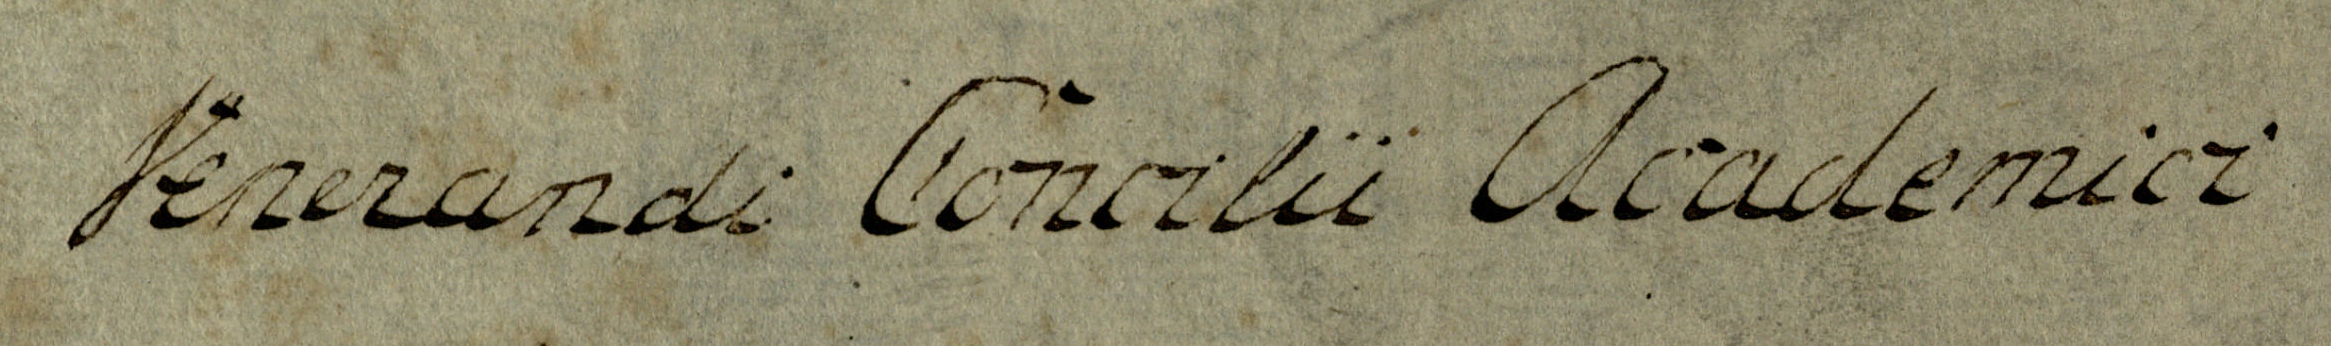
Venerandi concilii Academici
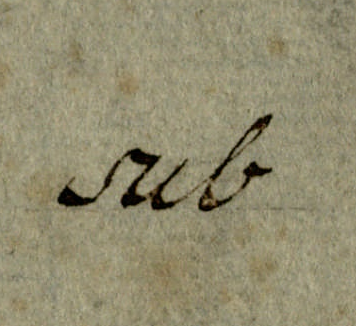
sub
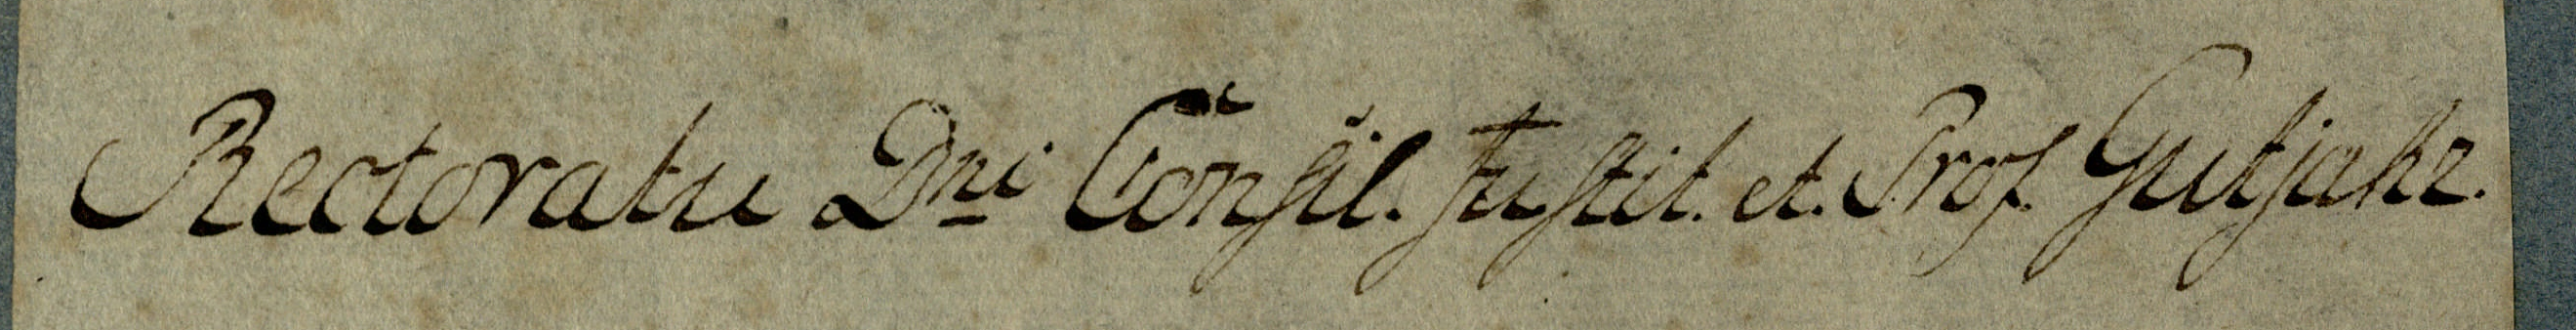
Rectoratu Dni Consil. Justit. et. Prof. Gutjahr
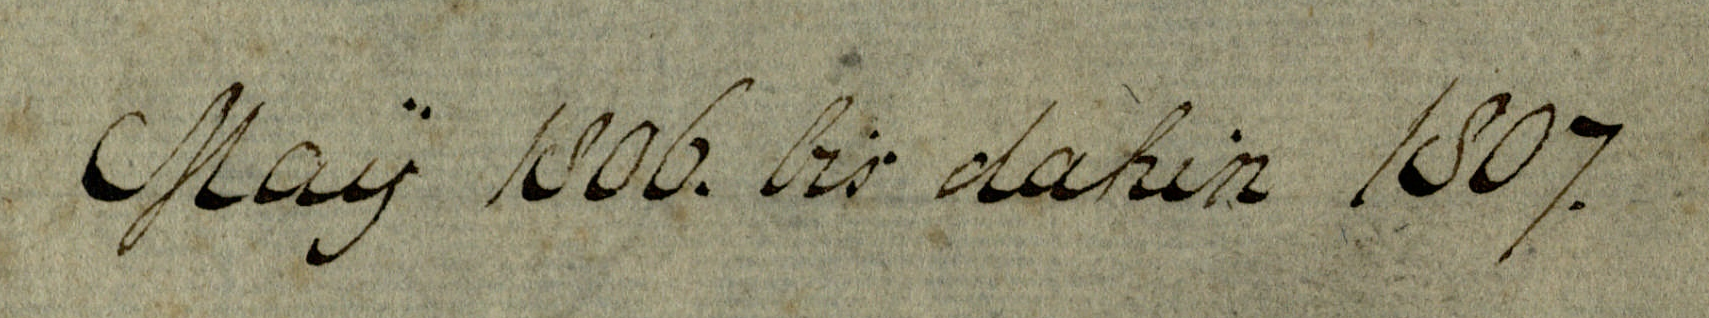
May 1806 bis dahin 1807.
